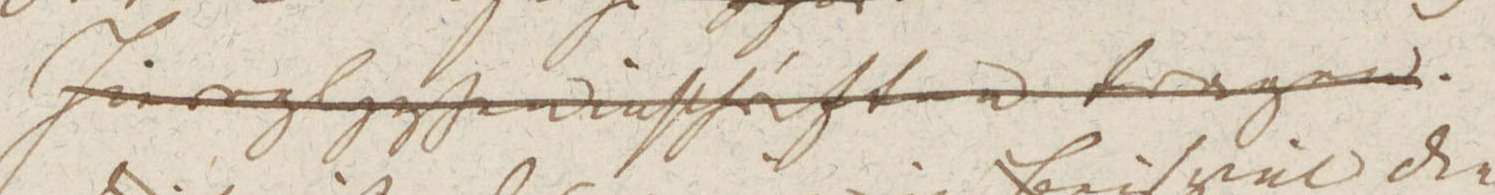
Hieroglypheninschriften tragen.
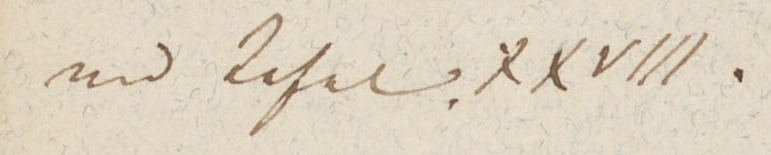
und Tafel. XXVIII.
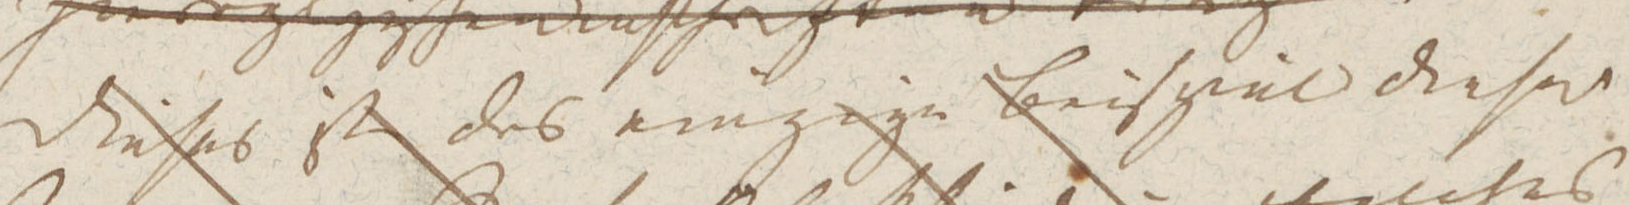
Dieses ist das einzige Beispiel dieser
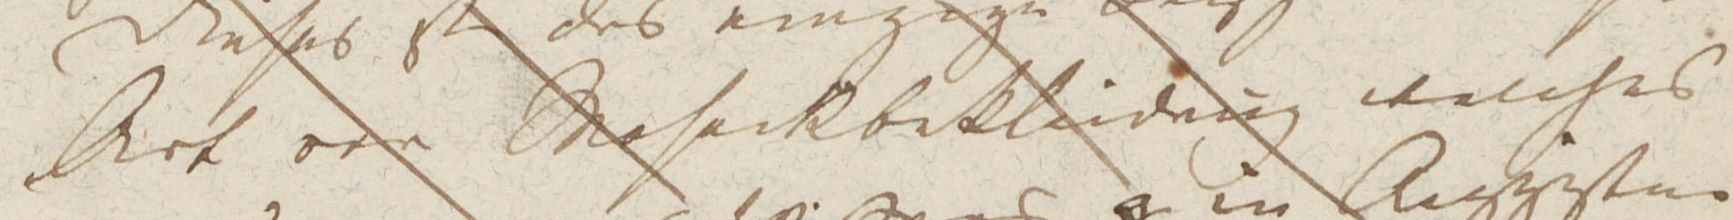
Art von Mosaikbekleidung welches
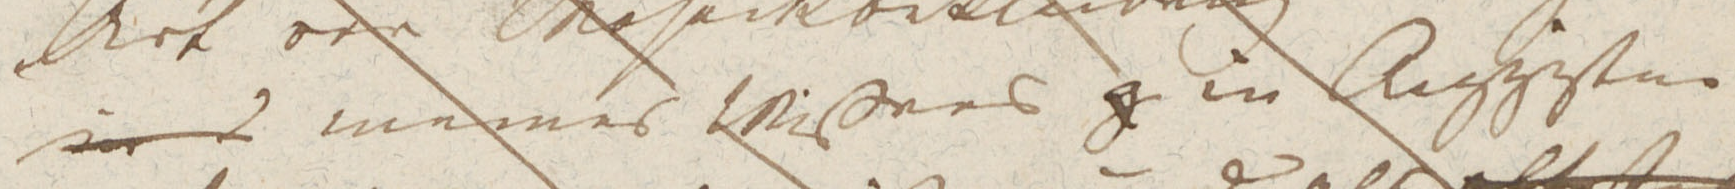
in meines Wissens g in Aegypten
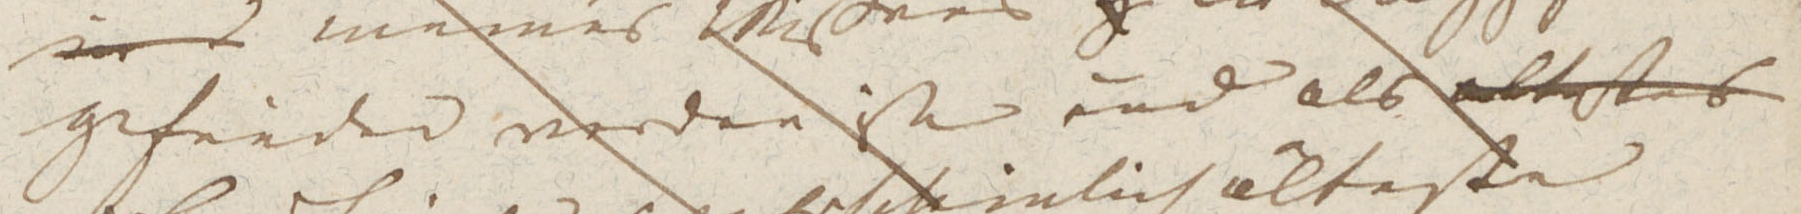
gefunden worden ist und als altestes
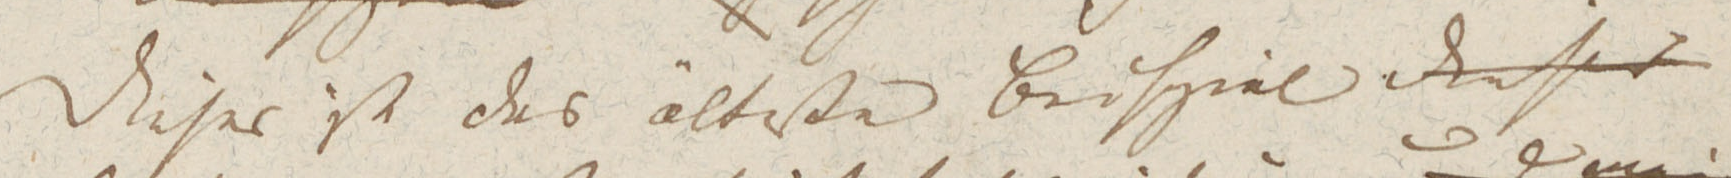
Dieser ist das älteste Beispiel dieser
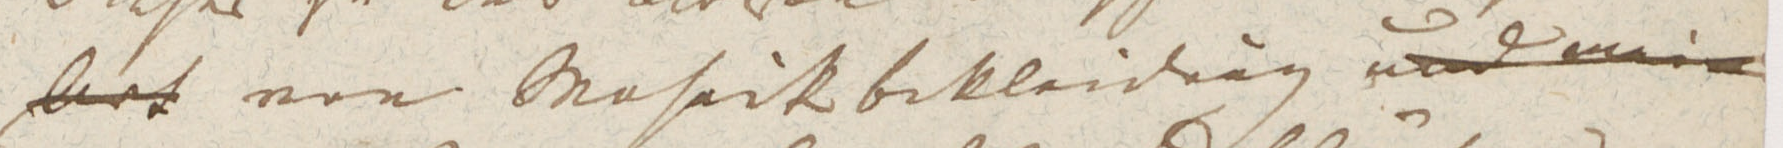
Art von Mosaikbekleidung und mei-
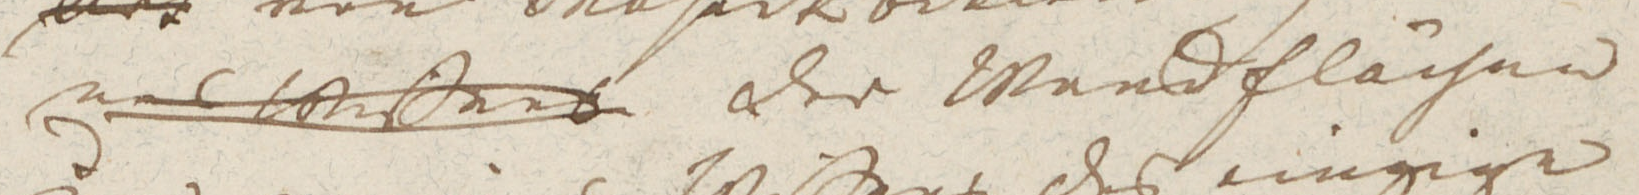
nes Wissens der Wandflächen
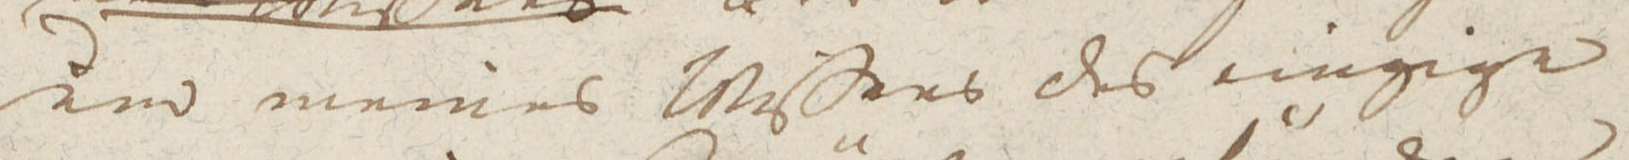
und meines Wissens das einzige
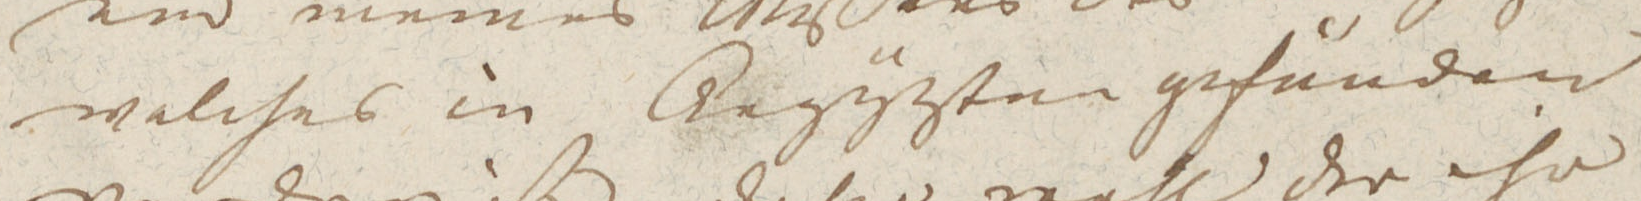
welches in Aegypten gefunden
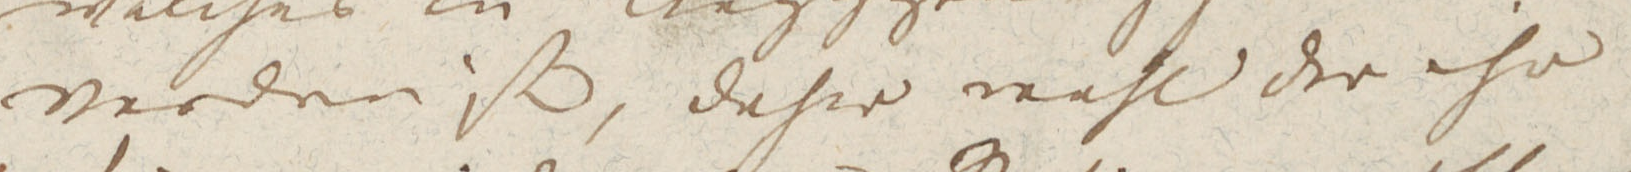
worden ist, daher wohl der ihr
